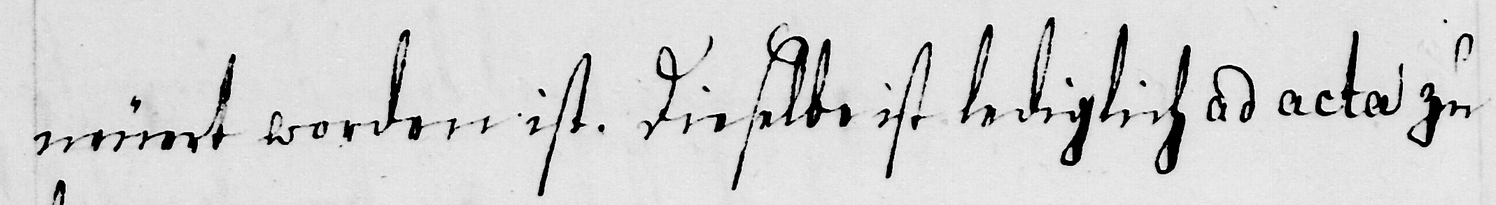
neuert worden ist. Dieselbe ist lediglich ad acta zu
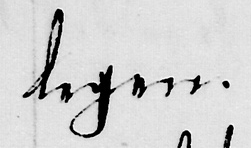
legen.
